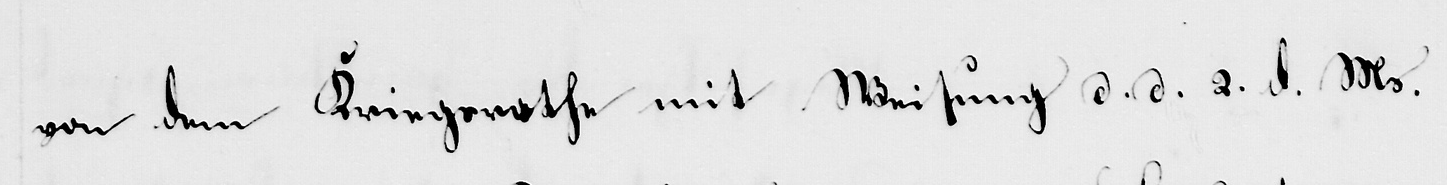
von dem Kriegsrathe mit Weisung d. d. 2. d. Ms.
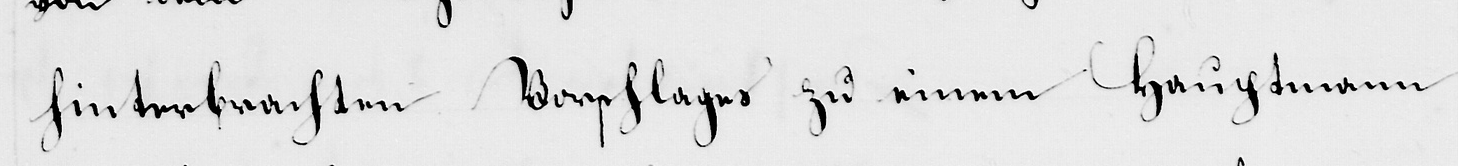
hinterbrachten Vorschlages zu einem Hauptmann
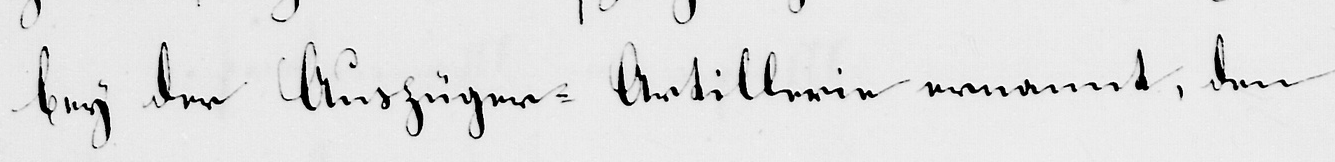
bey der Auszüger-Artillerie ernannt, den
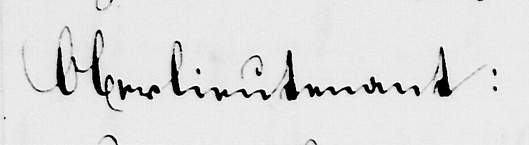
Oberlieutenant:
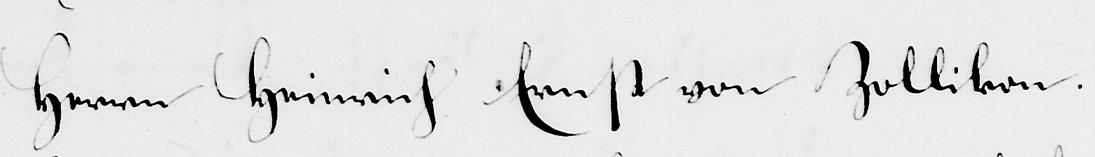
Herrn Heinrich Ernst von Zollikon.
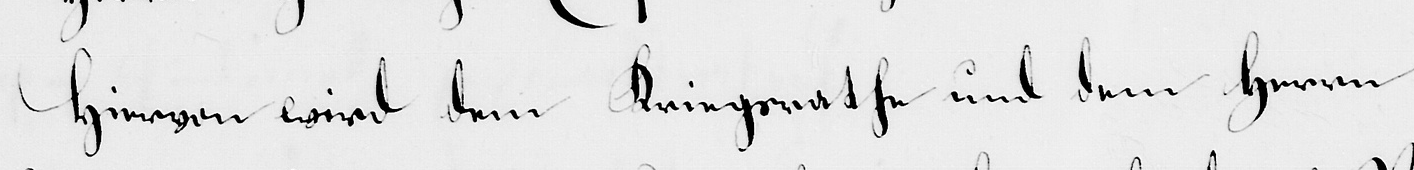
Hiervon wird dem Kriegsrathe und dem Herrn
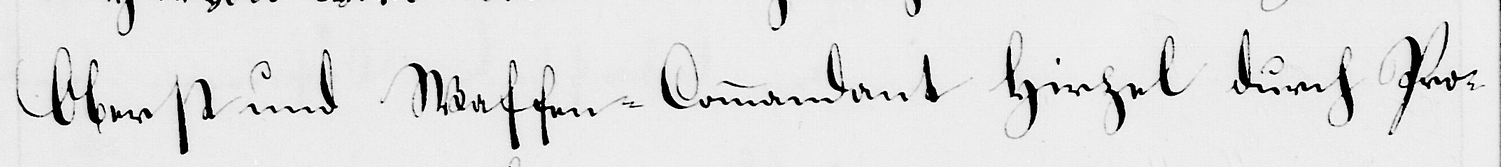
Oberst und Waffen-Commandant Hirzel durch Pro¬
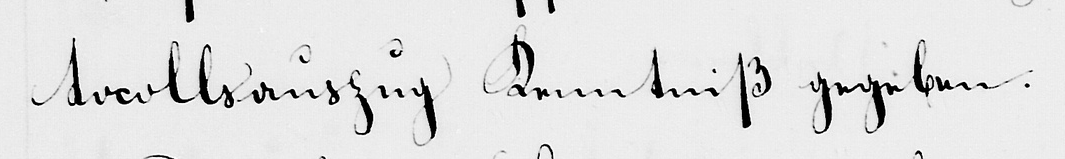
tocollsauszug Kenntniß gegeben.
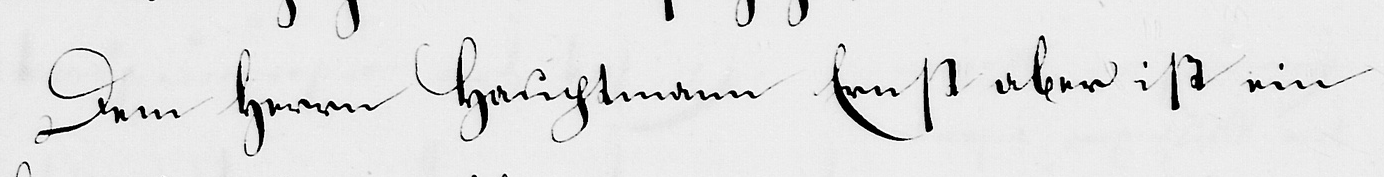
Dem Herrn Hauptmann Ernst aber ist ein
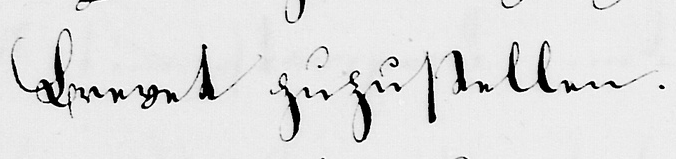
Brevet zuzustellen.
